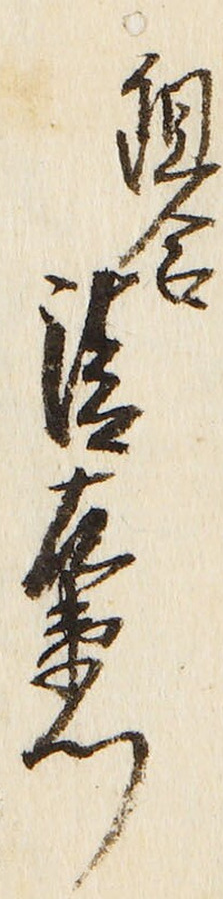清左衛門
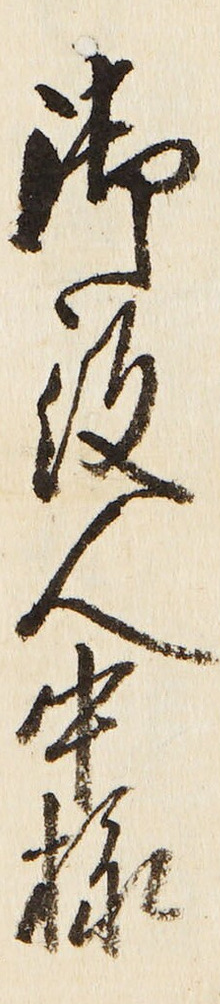御役人中様
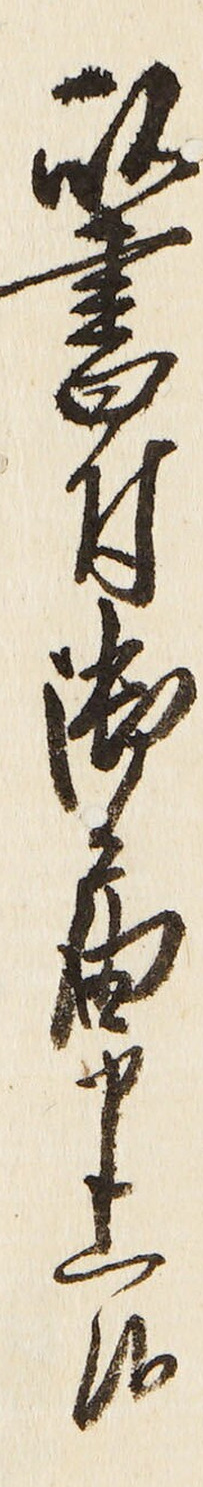以書付御届申上候
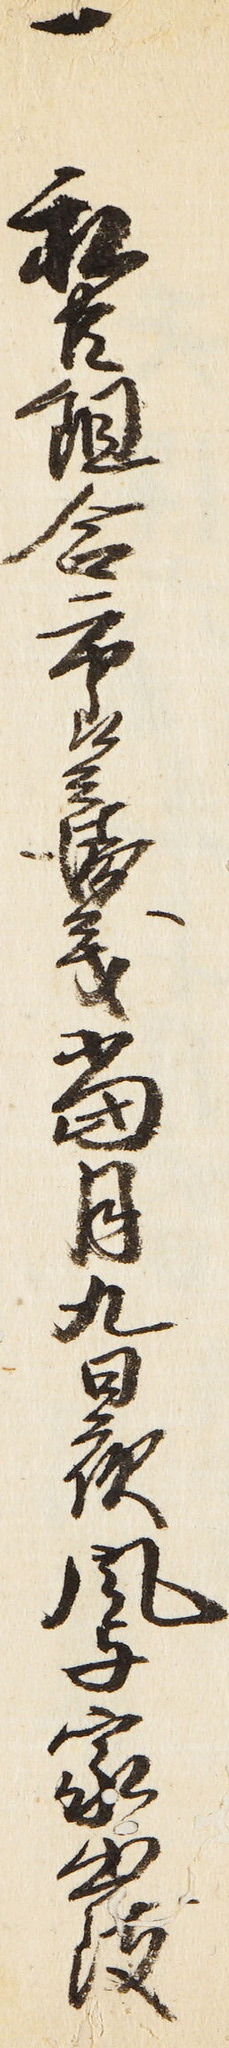一私共組合市郎兵衛義当月九日夜風与家出致
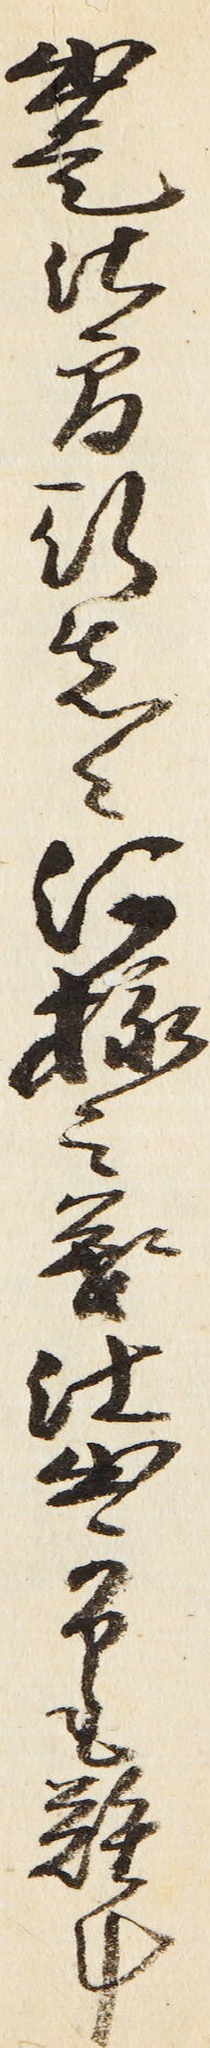出走仕候間行先ニ何様之義仕出可申も難計
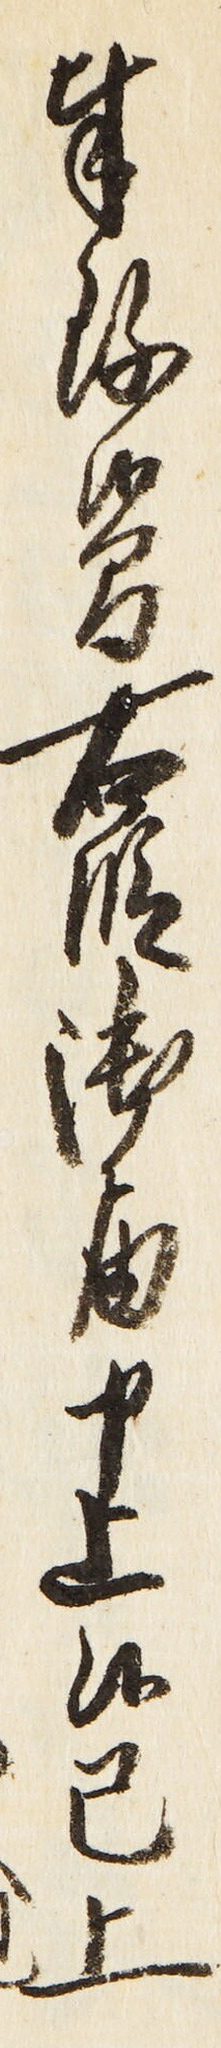奉存候間右段御届申上候已上
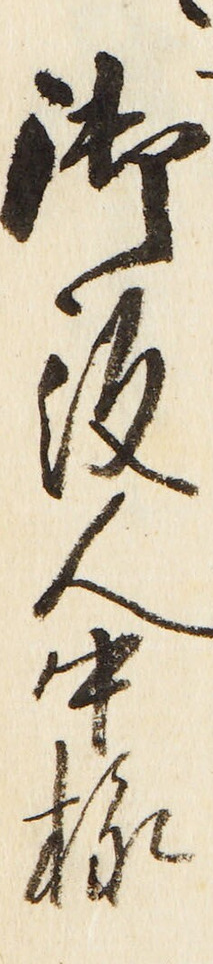御役人中様

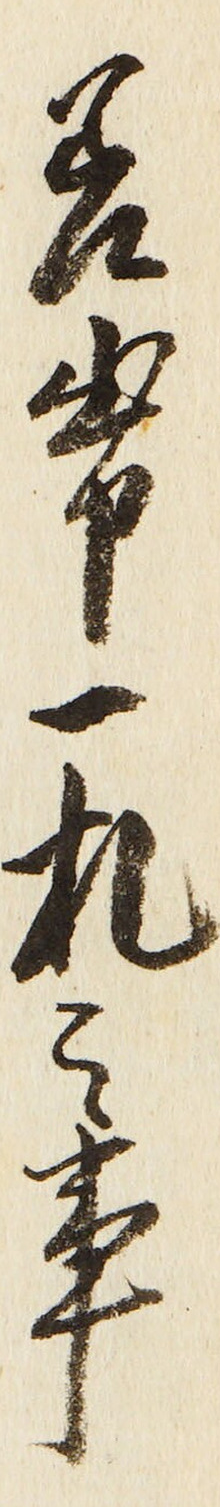差出申一札之事
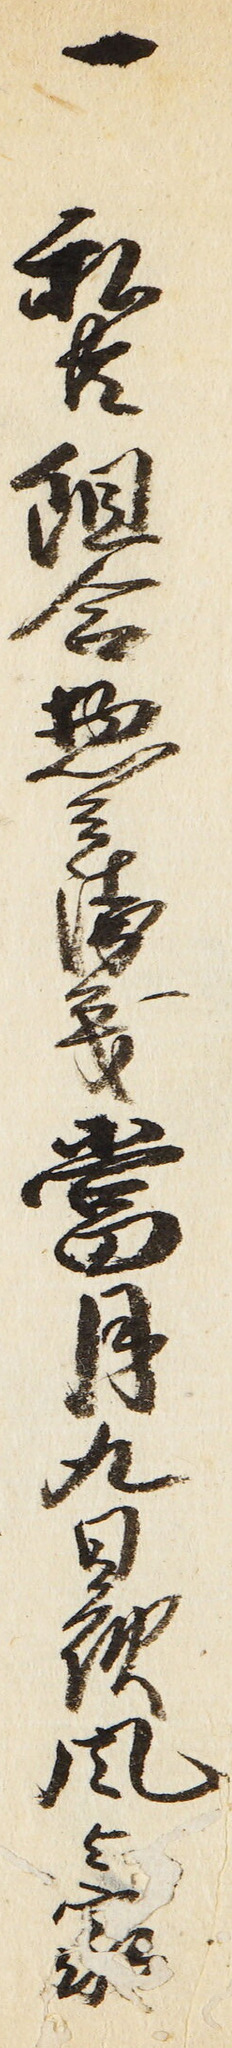一私共組合惣兵衛義当月九日夜風与家
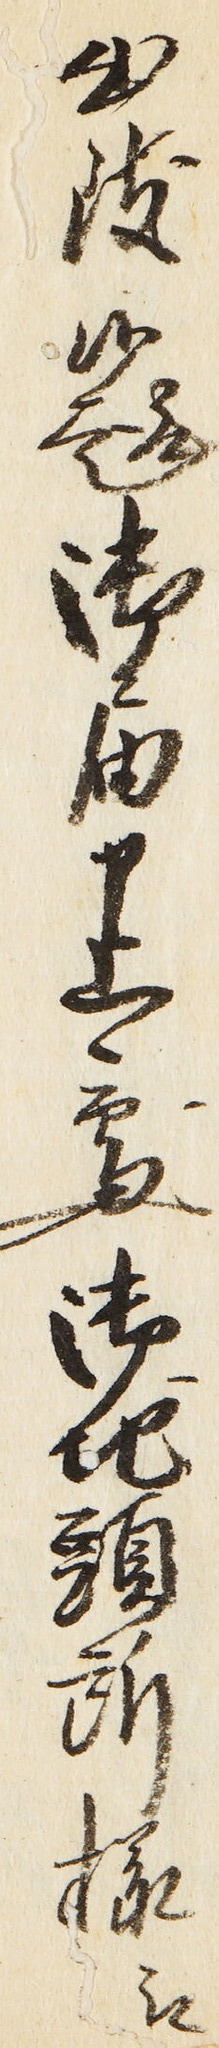出致候趣御届申上候処御地頭所様江
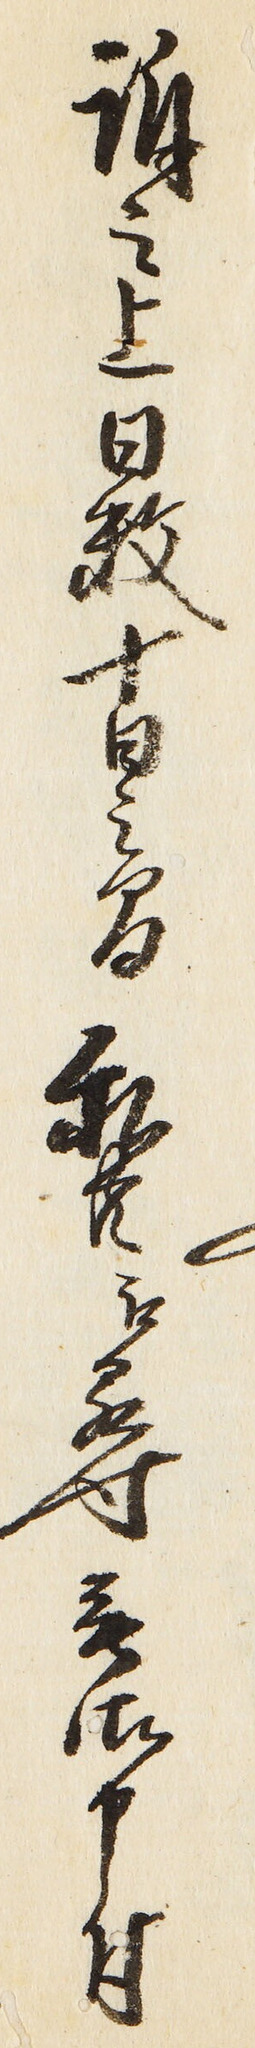訴之上日数十日之間私共江尋被御申付
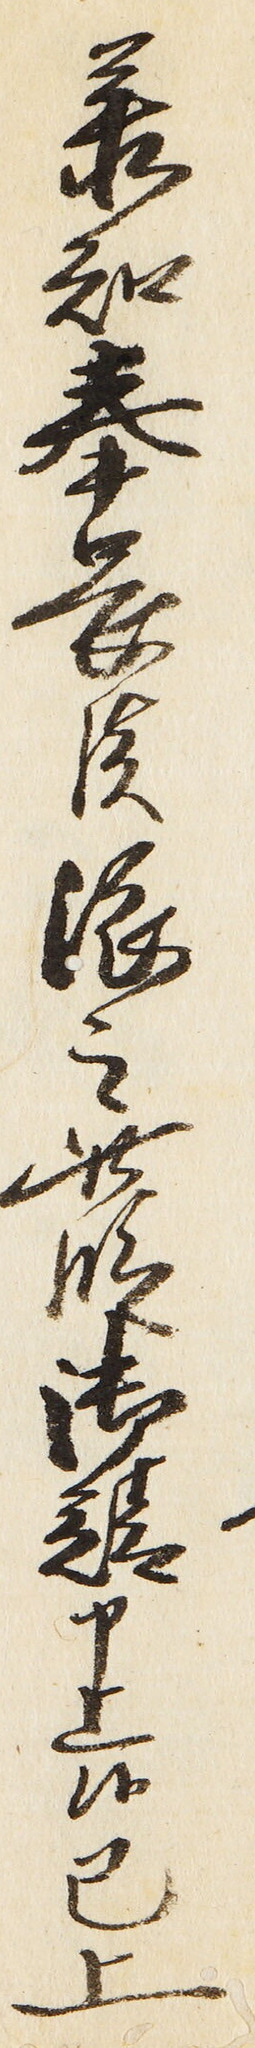承知奉畏候依之此段御請申上候已上
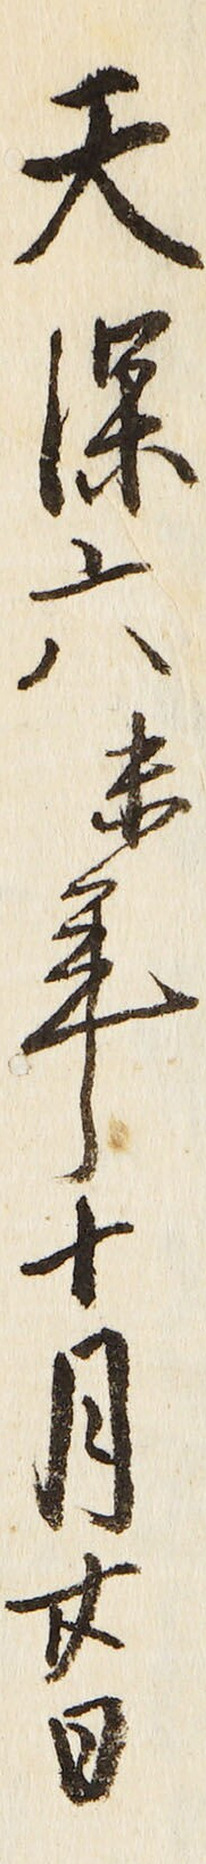天保六未年十月廿日
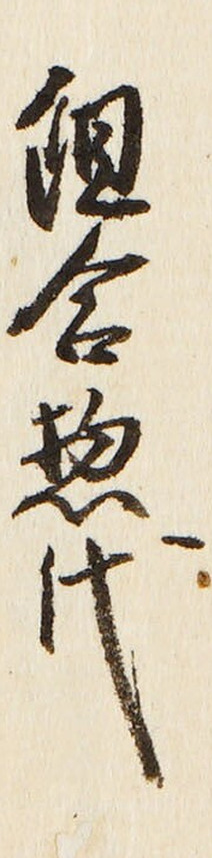組合惣代
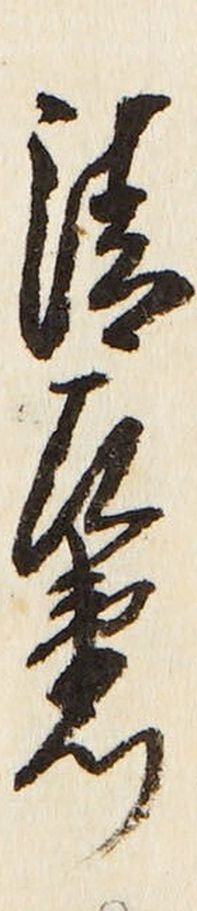清左衛門
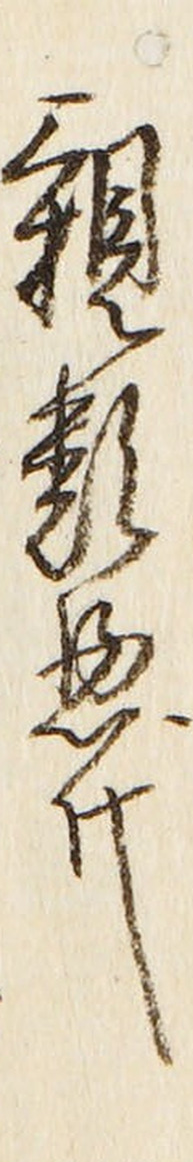親類惣代
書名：難船一件記録
